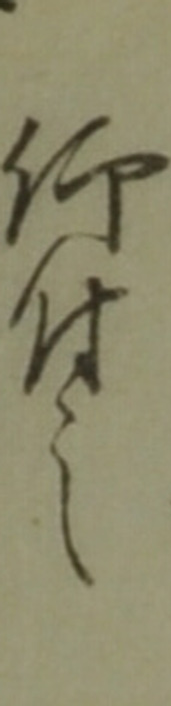仰付之
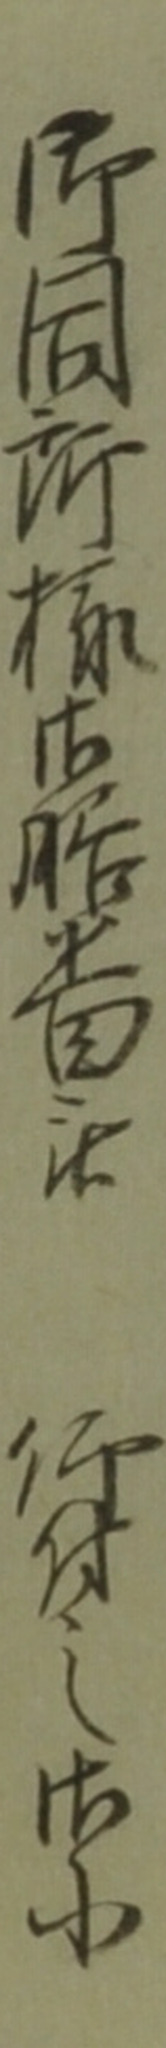御同所様御膳番被仰付之御小
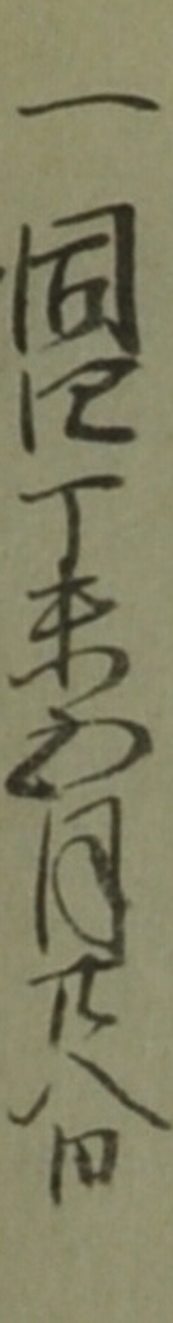一同四丁未五月廿八日
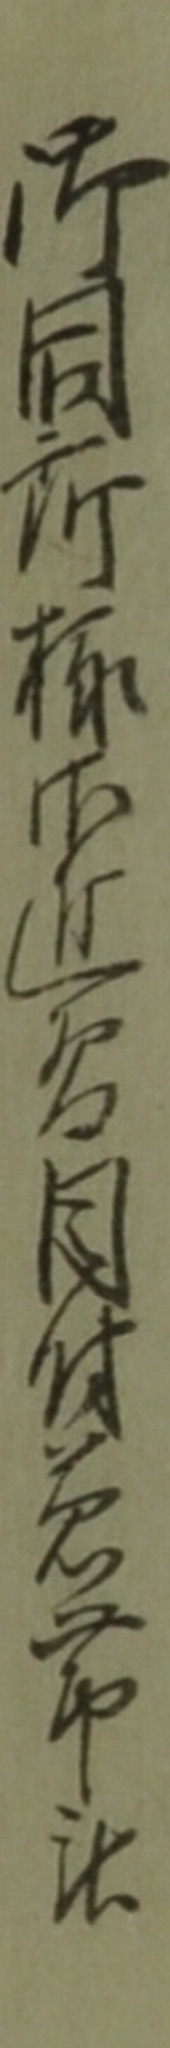御同所様御近習目付兼帯被
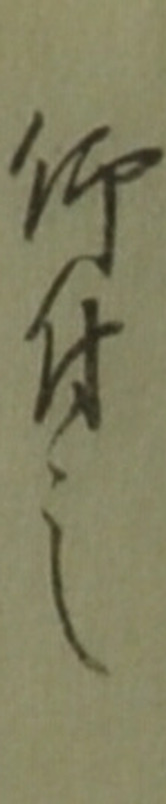仰付之
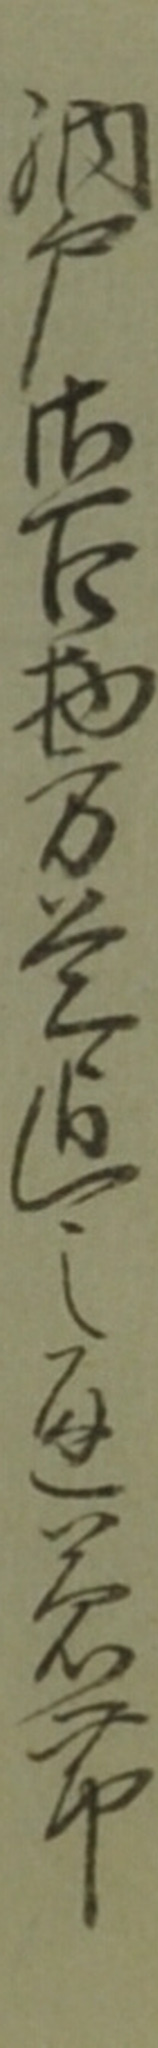納戸御召物方是迄之通兼帯

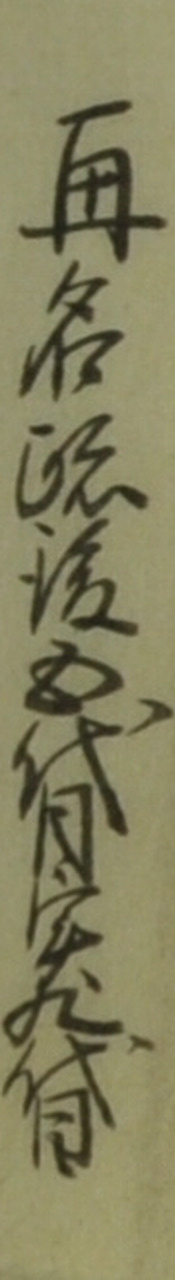再名跡後五代目実九代目
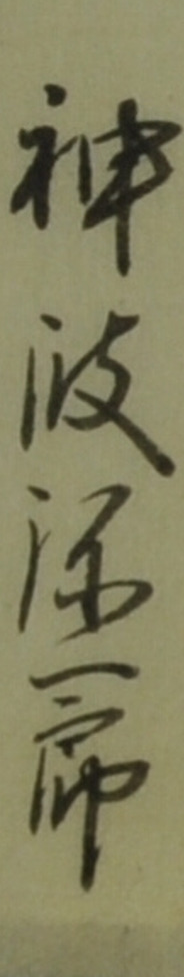神波弥一郎
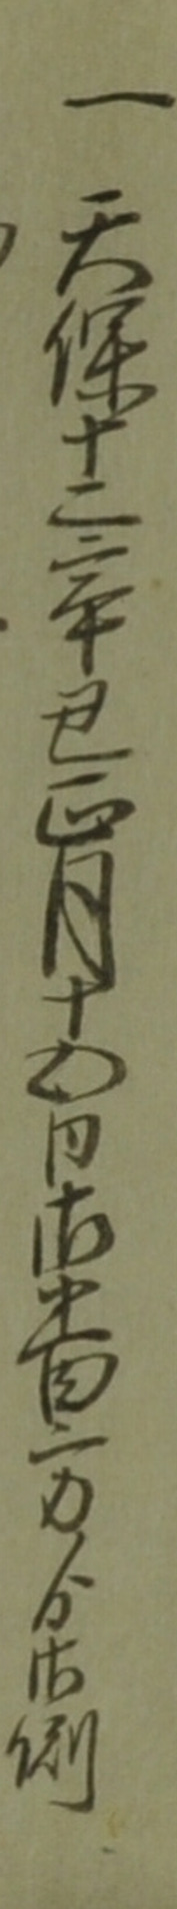一天保十二辛丑正月十五日御番方ゟ御側
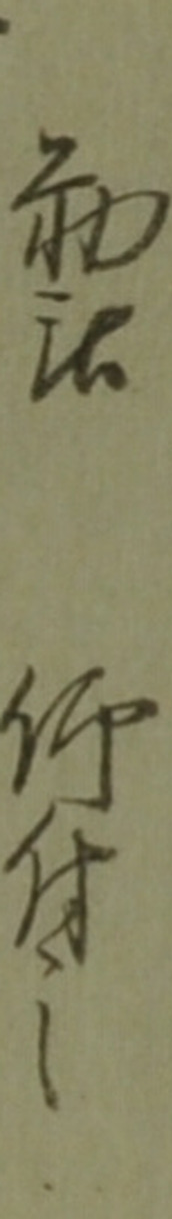勤被仰付之
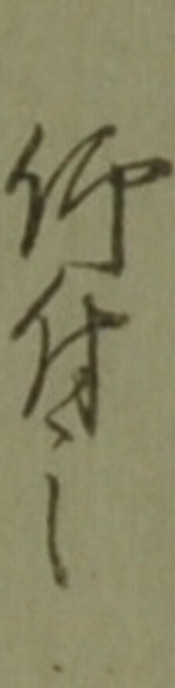仰付之
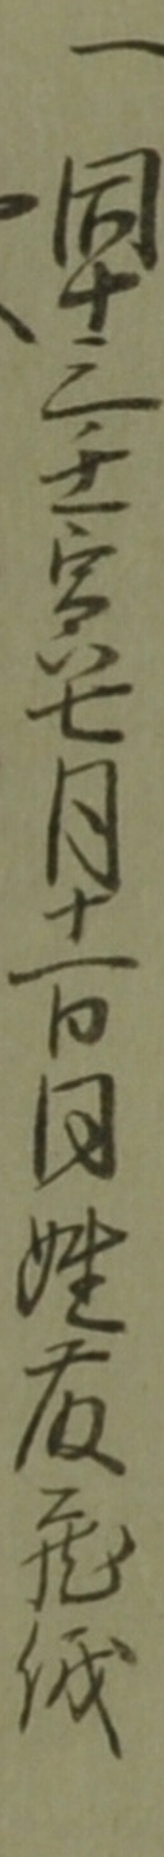一同十三壬寅七月十一日同姓友蔵儀
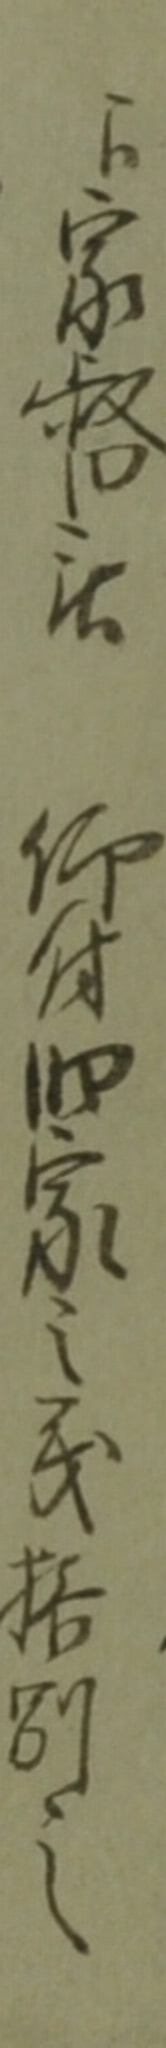江家格被仰付旧家之義格別之
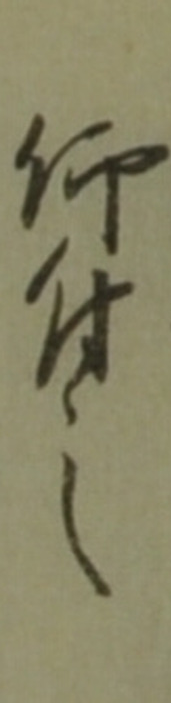仰付之
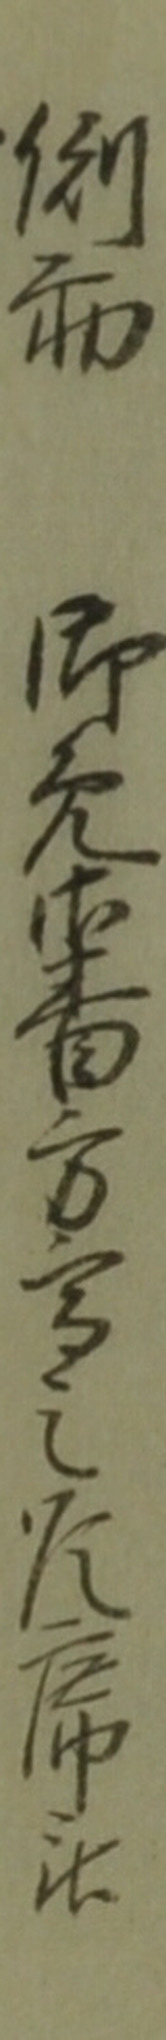側勤御免御番方高之順席被
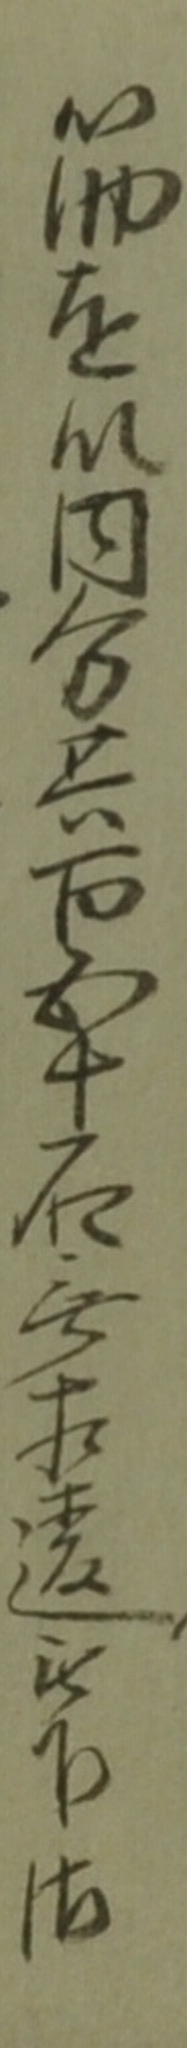筋を以内分共百五十石無相違被下御
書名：諸御役代々録（五）
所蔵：伊那市立高遠町図書館・合同会社AMANE
